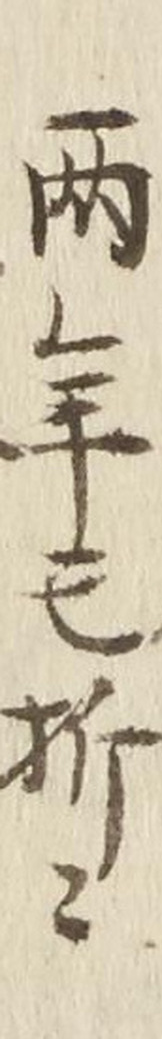両年も折々
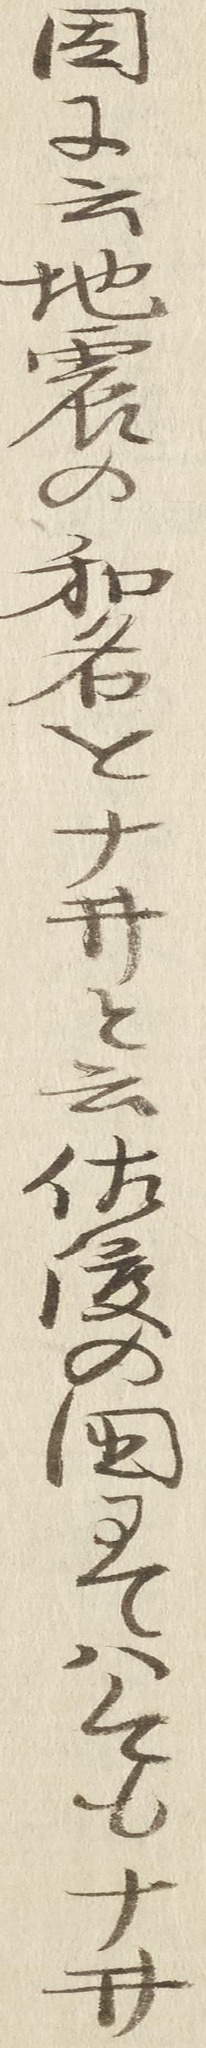因に云地震の和名をないと云佐渡国にては今もない
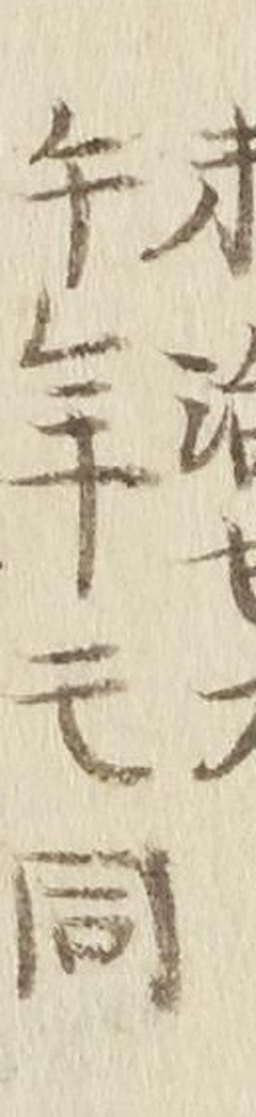午年も同
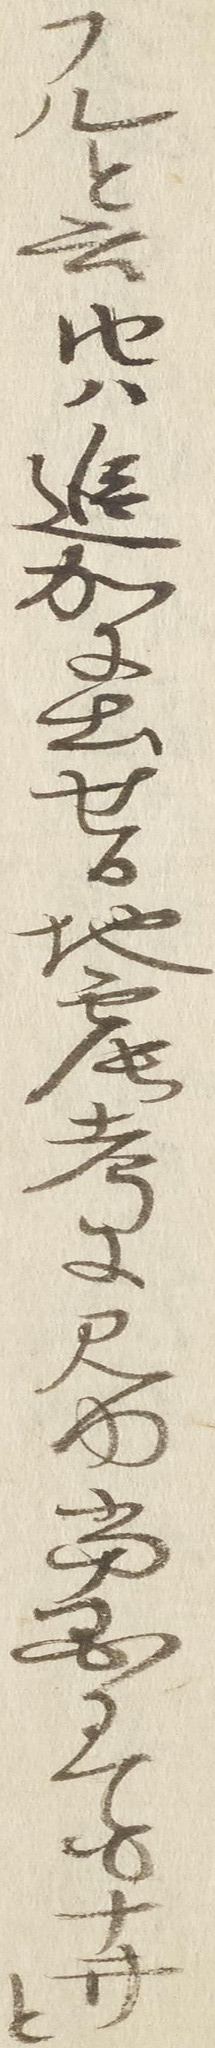ふると云由は追加に出せる地震考に見ゆ当国にてもないと
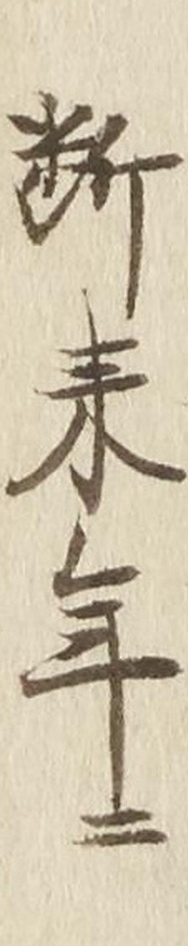断来年に
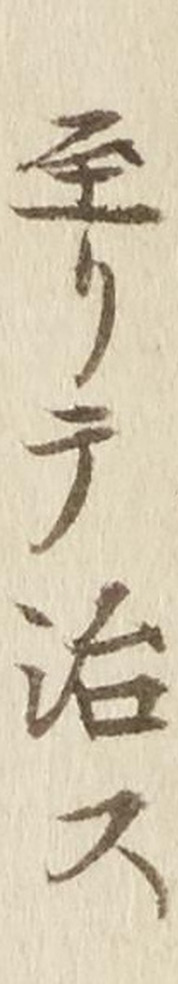至りて治す
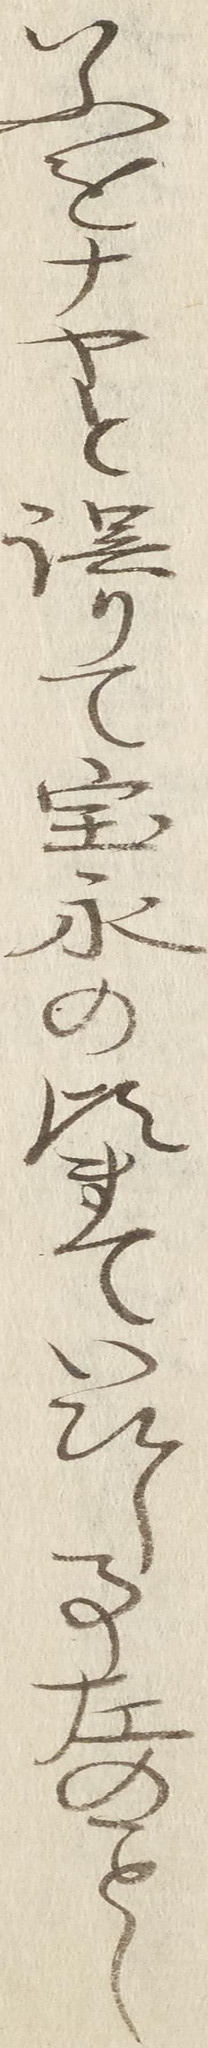いふをなやと誤りて宝永の頃までいひし事左のことし
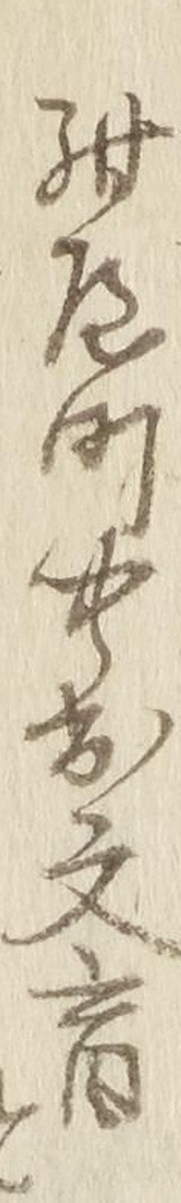紺屋町聞書文音と
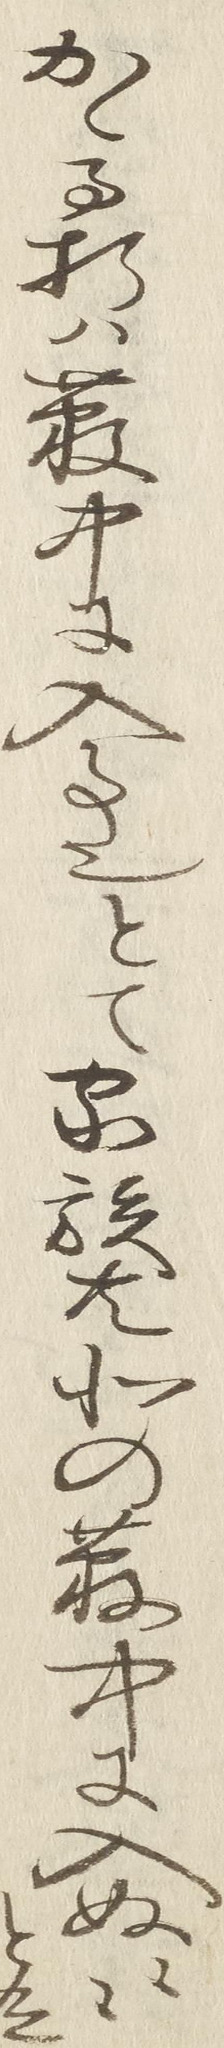かゝる折は藪中に入事也とて家族共北の藪中に入ぬ々々と有
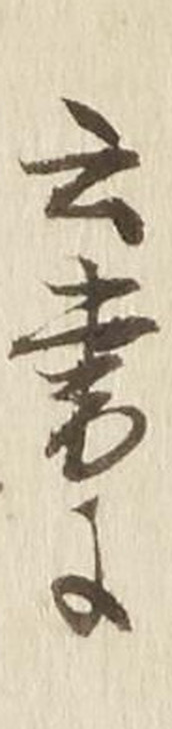云書に
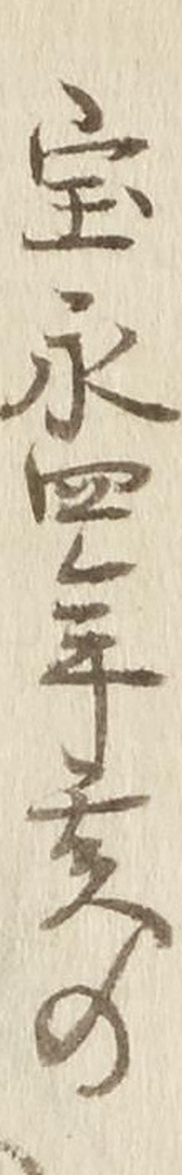宝永四年亥の
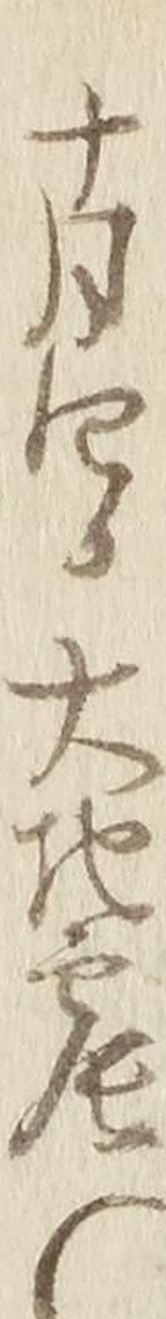十月四日大地震
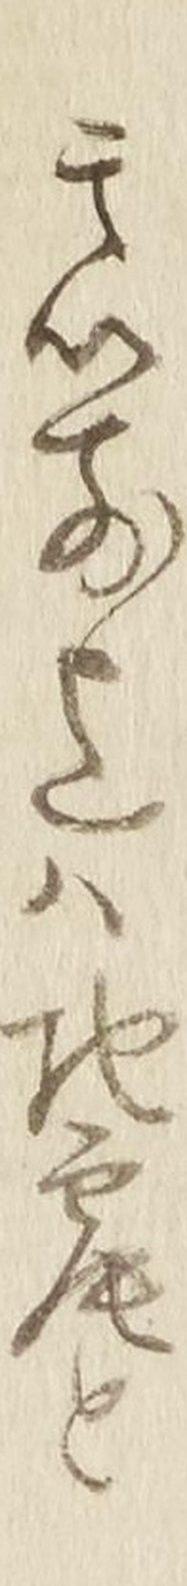其以前迄は地震と
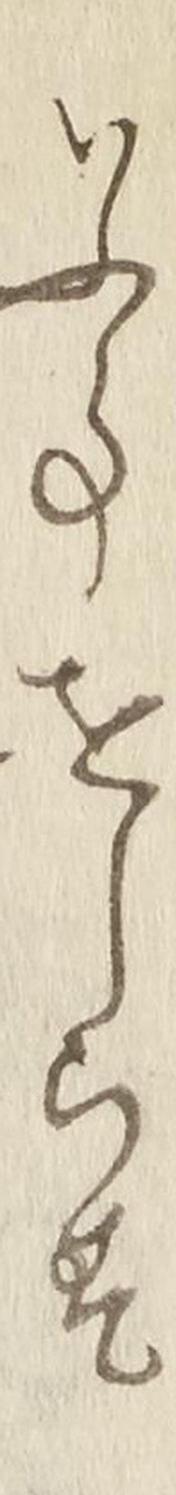いふ事をしらす
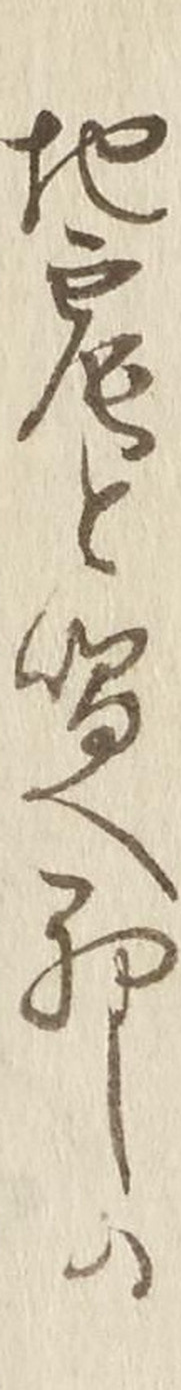地震と唱へ初しの
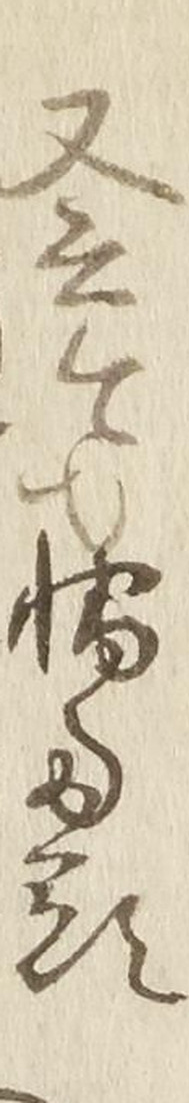又云今も幡多郡
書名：地震記　上
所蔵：東京大学地震研究所図書室 Earthquake Research Institute Library, The University of Tokyo, JAPAN
